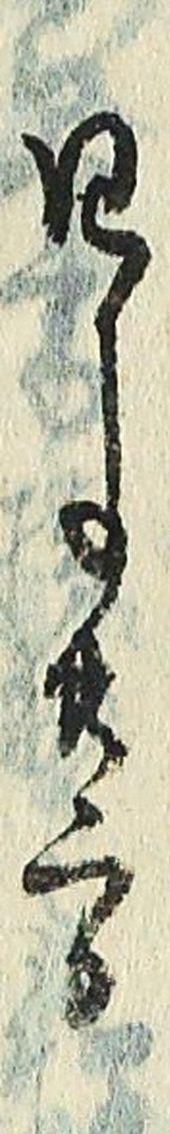四月廿二日
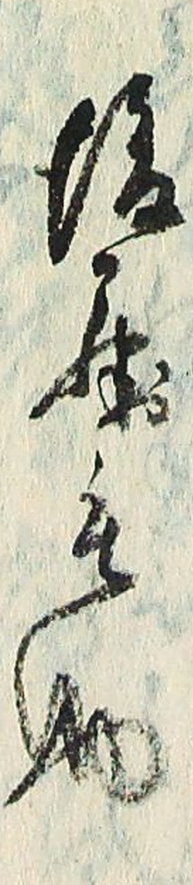後藤庄助
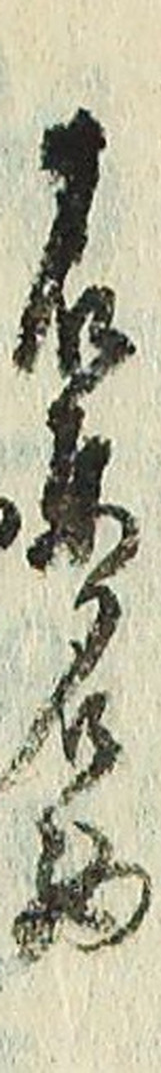名東名西
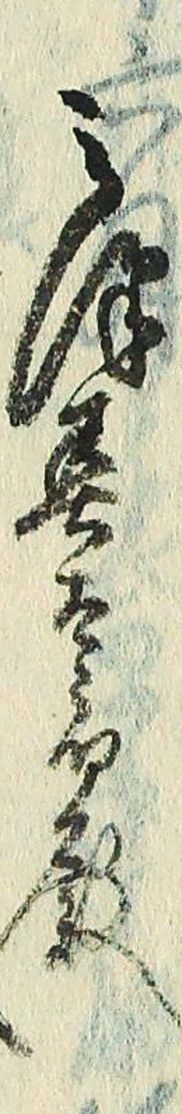三沢春太郎殿
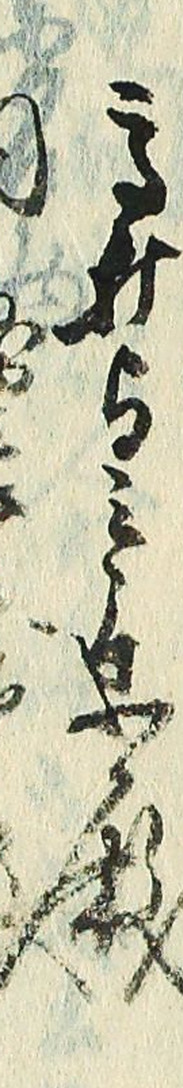高井与三兵衛殿
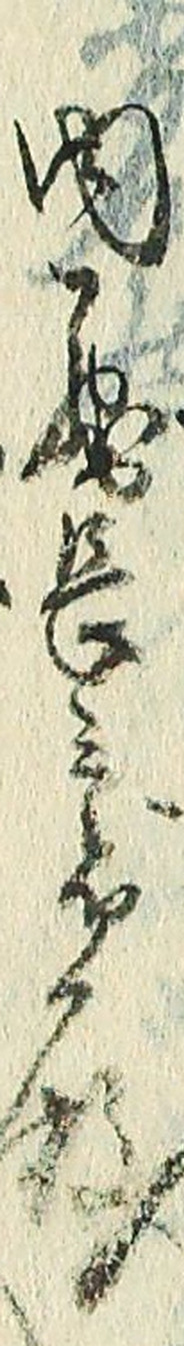内藤長三郎殿
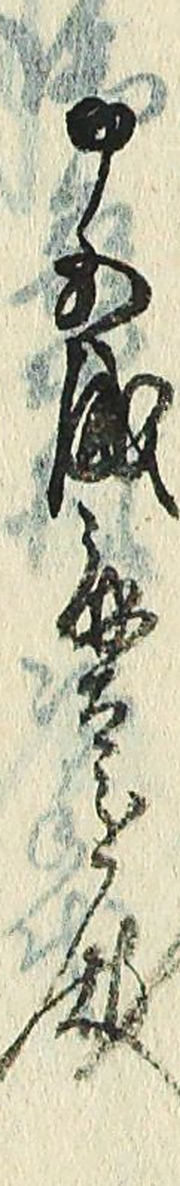宮城麻太郎殿
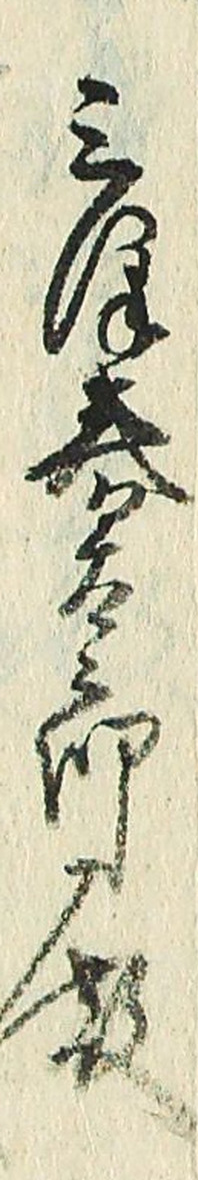三沢春太郎殿
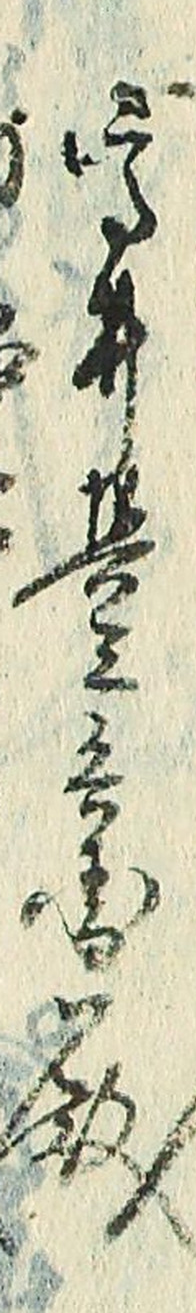高井与三兵衛殿
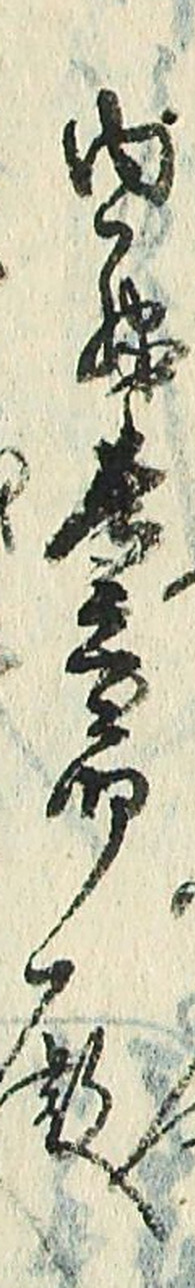内藤長三郎殿
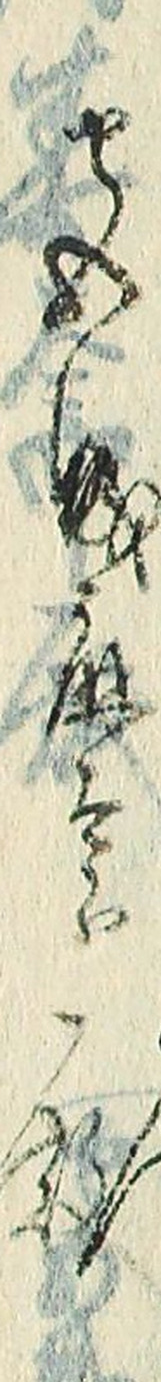宮城麻太郎殿

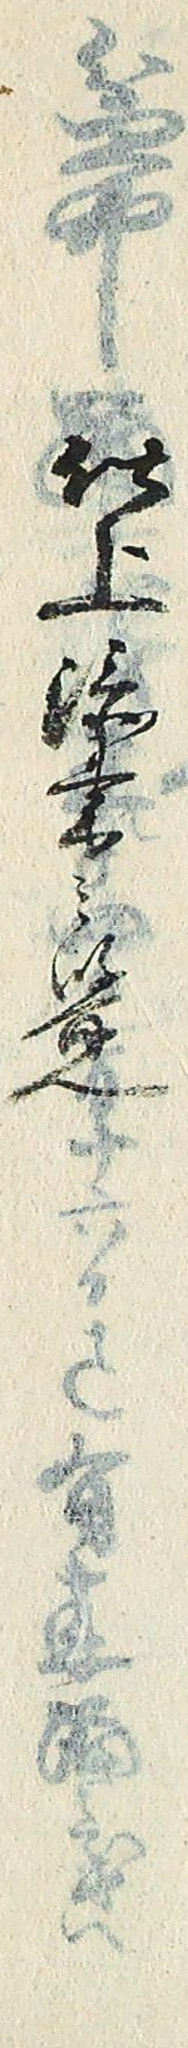仕上添書之覚
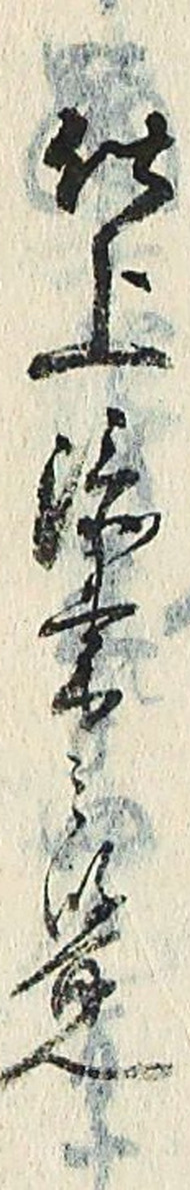仕上添書之覚
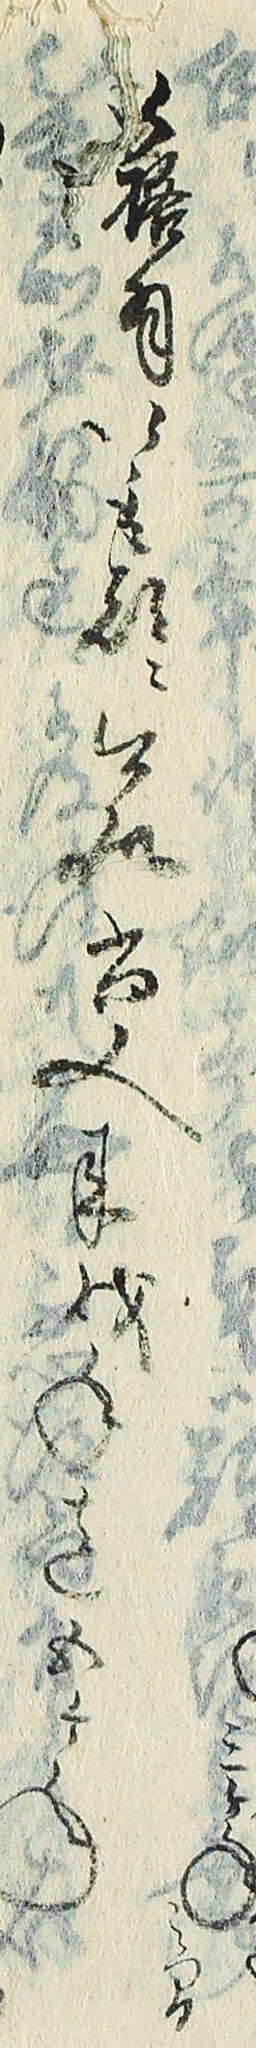御格外御取都に候処尚又来戌年迄三ケ年之間
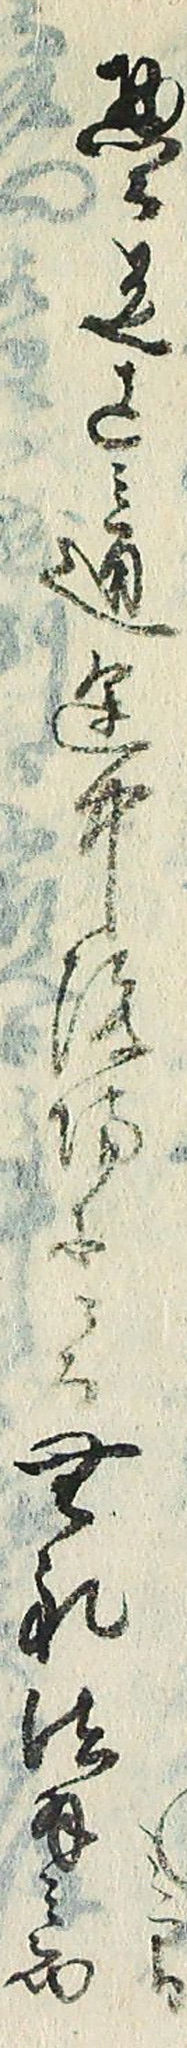惣而是迄之通途中渡場等に而無礼法外之者
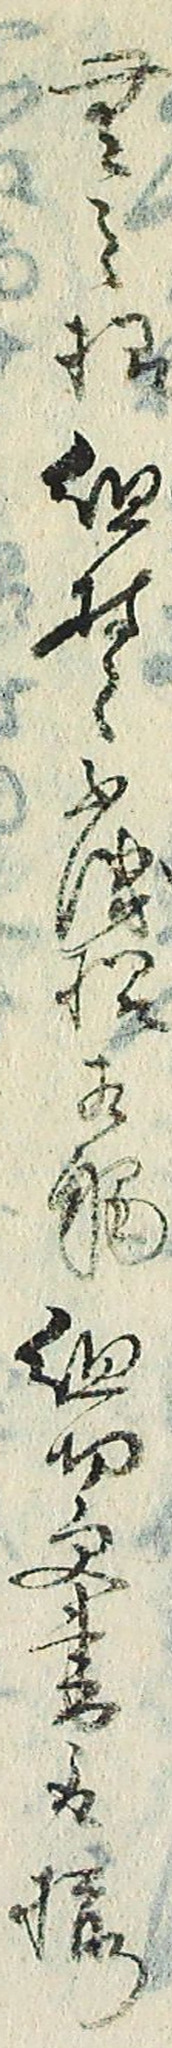無之様組村々不洩様相触組切受書取揃
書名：諸御用御□受書控
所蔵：鳴門教育大学 Naruto University of Education
